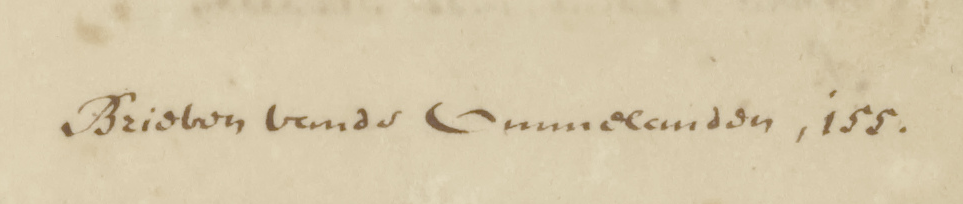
Brieven vande Ommelanden, 155.
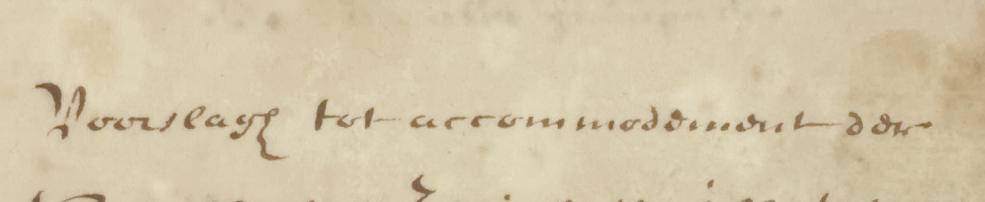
Voorslagh tot accommodement der
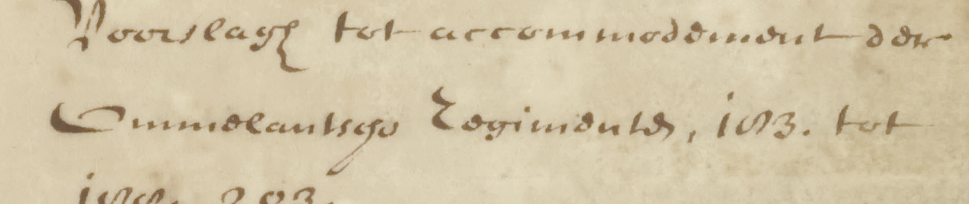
Ommelantsche regimenten, 183. tot
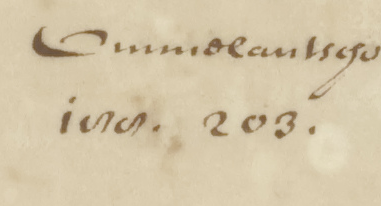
188. 203.
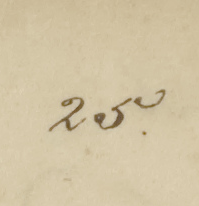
25.
